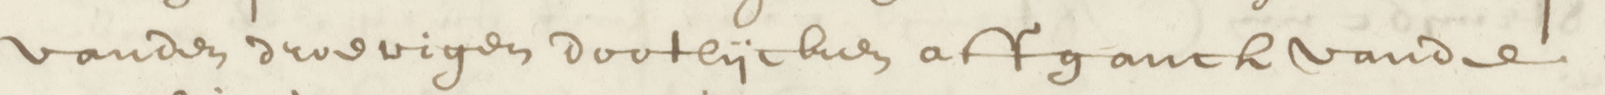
vanden droevigen dootlijcken affganck vande
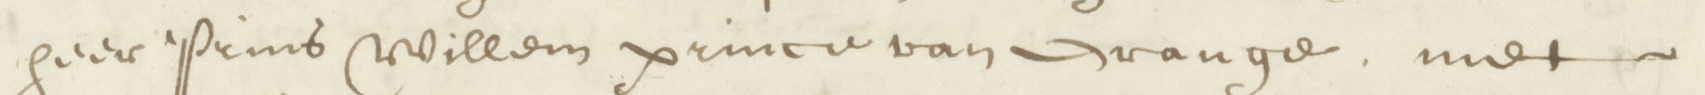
heer Prins Willem prince van Orange, met
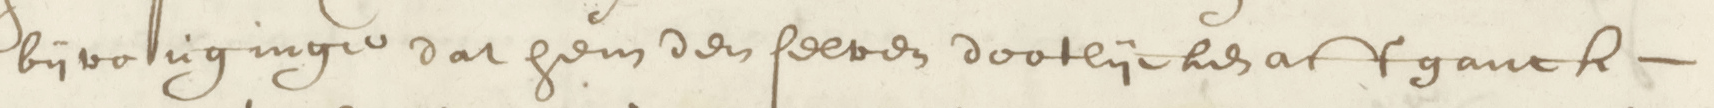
bijvouginge dat hem den selven dootlijcken affganck —
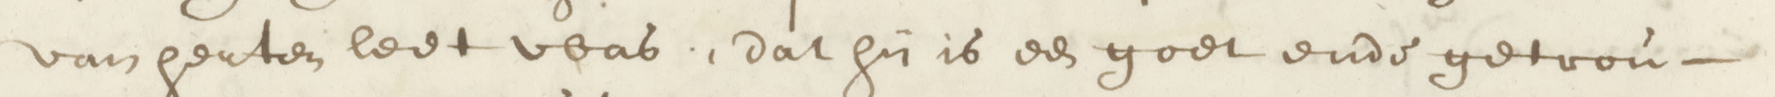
van herten leet was, dat hij is een goet ende getrou—
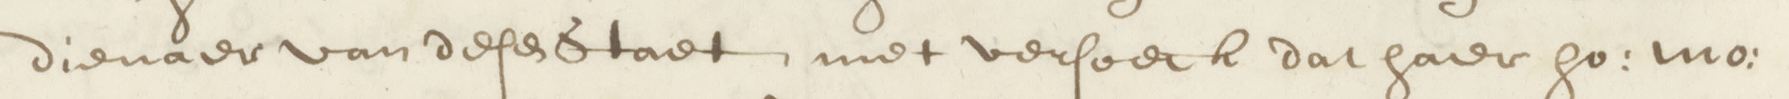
dienaer van desen Staet, met versoeck dat haer ho:mo:
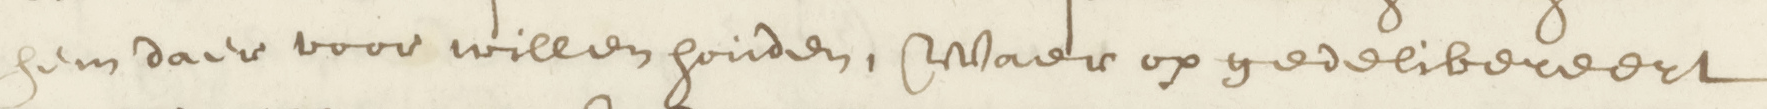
hem daer voor willen houden. Waer op gedelibereert
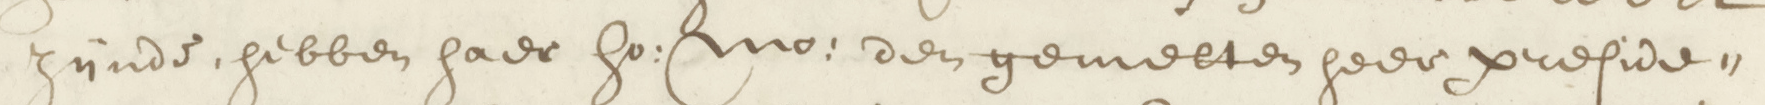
zijnde, hebben haer Ho:Mo: den gemelten heer preside„
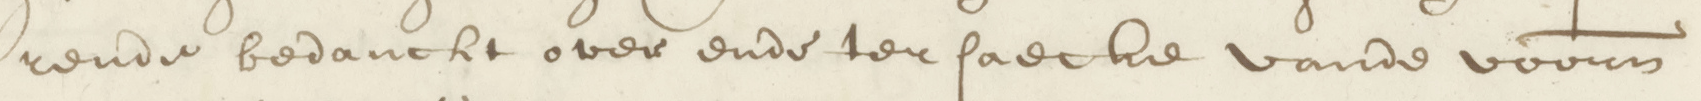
rende bedanckt over ende ter saecke vande voorn
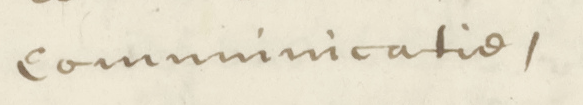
Communicatie
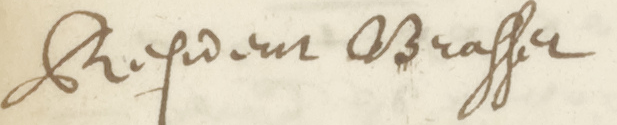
Resident Brasset
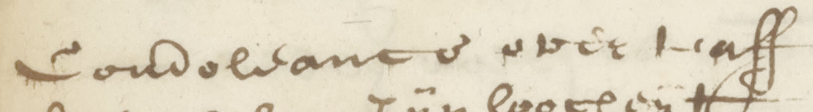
Condoleance over t‛aff
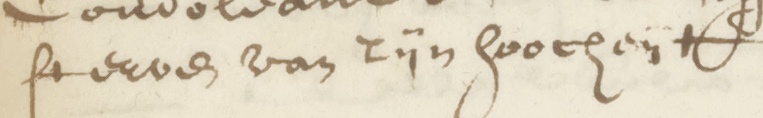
sterven van zijn hoocheijt
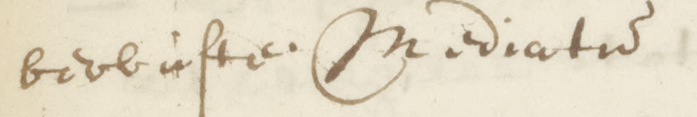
bewuste Mediatie
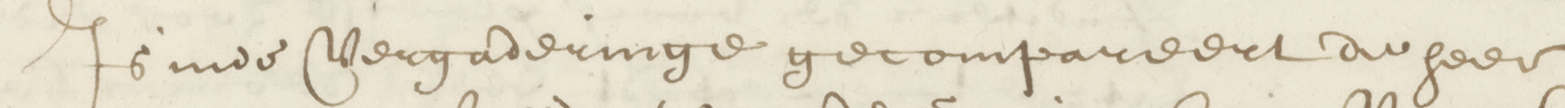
Is inde Vergaderinge gecompareert de heer
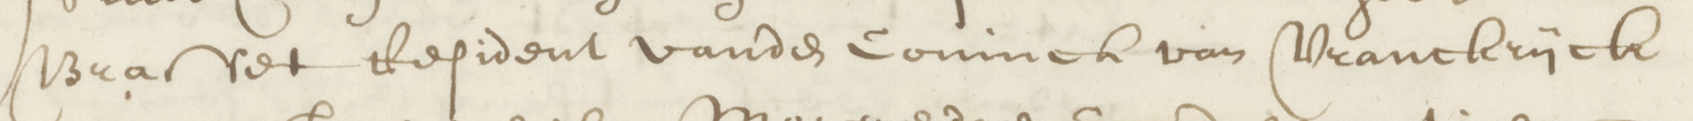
Brasset Resident vanden Coninck van Vranckrijck
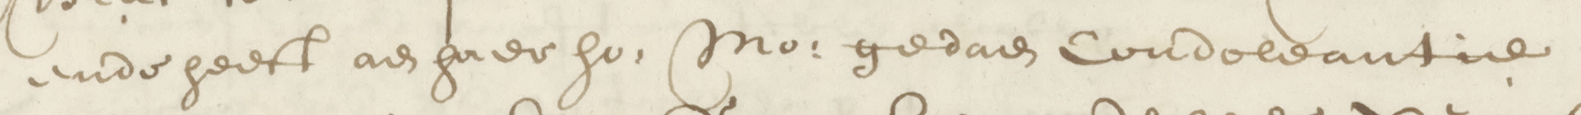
ende heeft aen haer ho:Mo: gedaen Condoleantie
